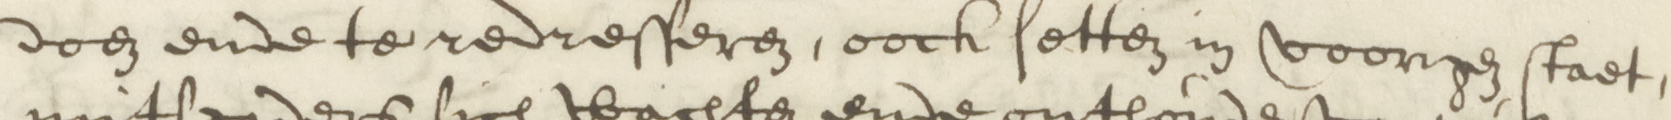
doen ende te redresseren, oock setten in voorigen staet,
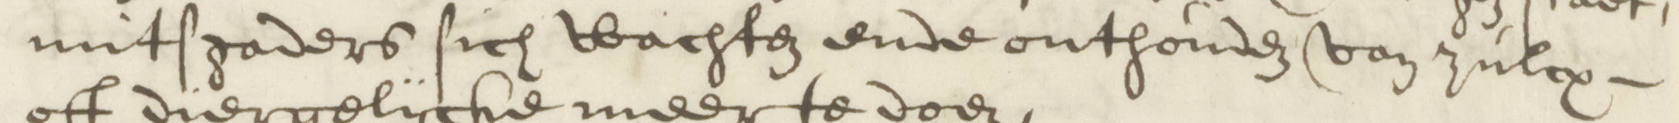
mitsgaders sich wachten ende onthouden van zulcx —
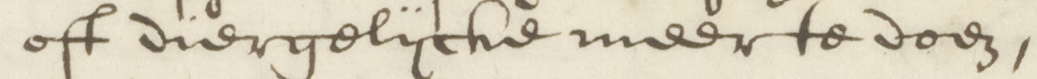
oft diergelijcke meer te doen.
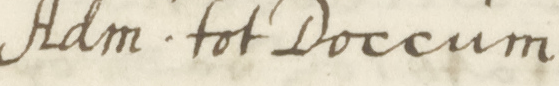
Admt. tot Doccum
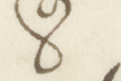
q
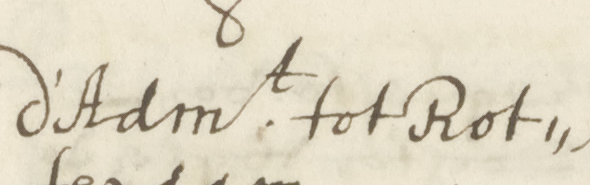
d‛Admt. tot Rot„
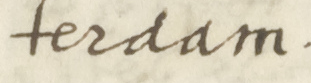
terdam.
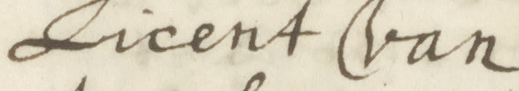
Licent van
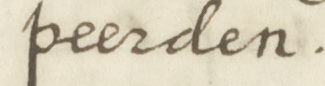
peerden.
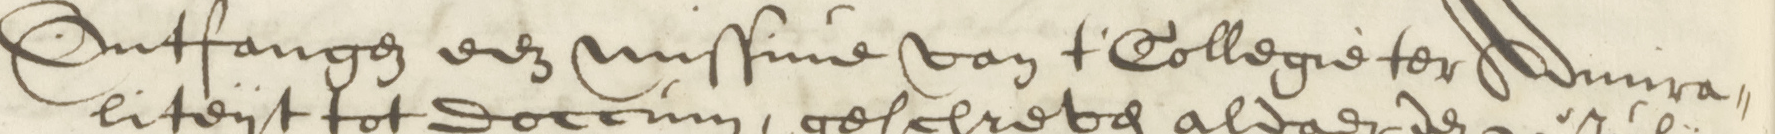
Ontfangen een Missive van t‛Collegie ter Admira„
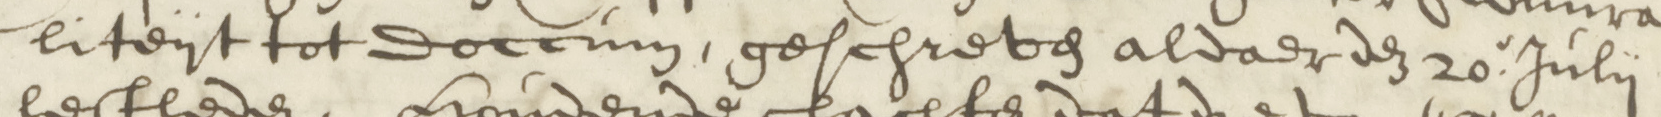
liteijt tot Doccum, geschreven aldaer den 20e Julij
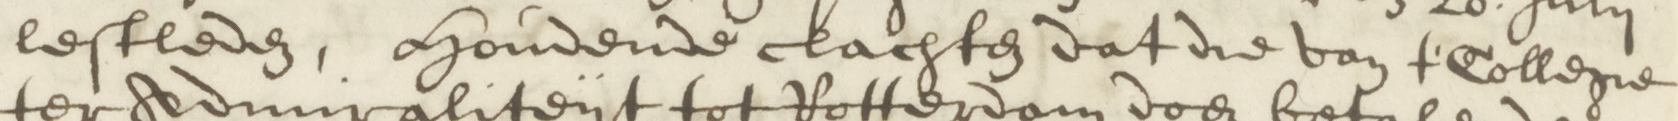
lestleden, Houdende clachten dat die van t‛Collegie
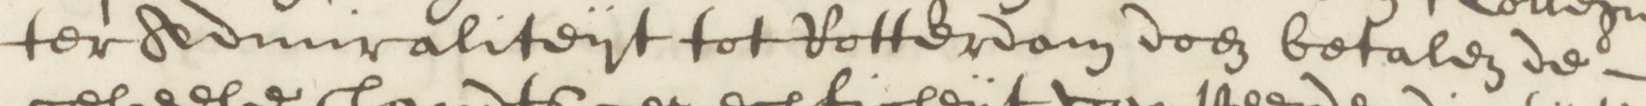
ter Admiraliteijt tot Rotterdam doen betalen de —
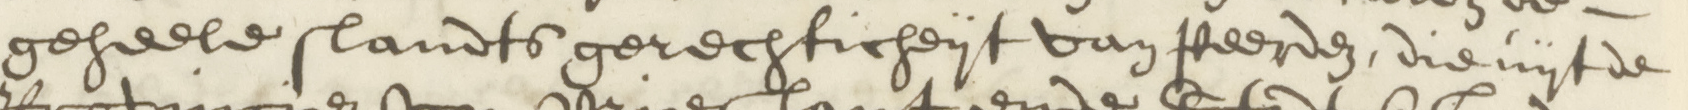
geheele slandts gerechticheijt van peerden, die uijt de
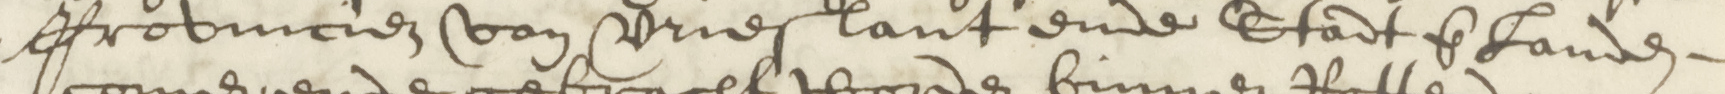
Provincien van Vrieslant ende Stadt & Landen —
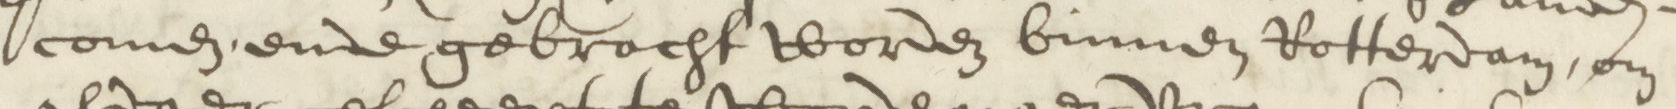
comen ende gebracht worden binnen Rotterdam, om
